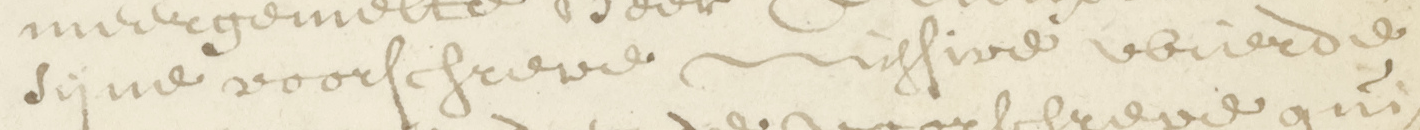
sijne voorschreve missive wierde
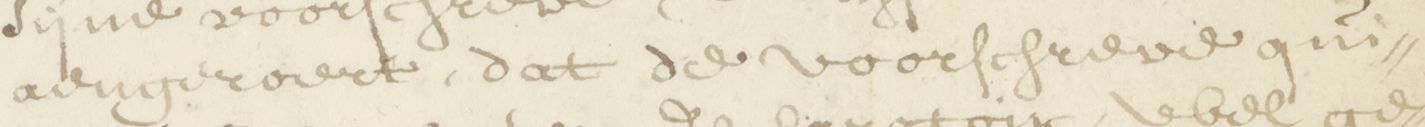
aengeroert, dat de voorschreve qui„
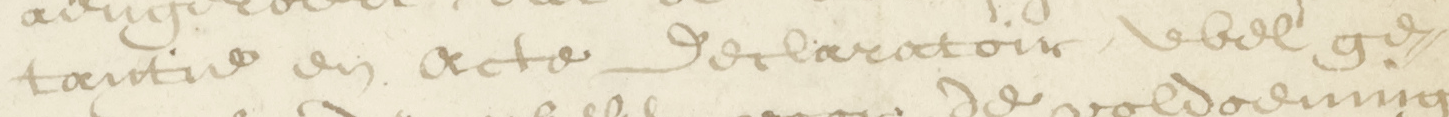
tantie en acte Declaratoir wel ge„
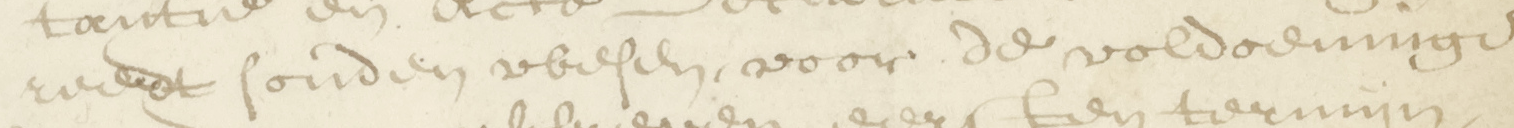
reedt souden wesen, voor de voldoeninge
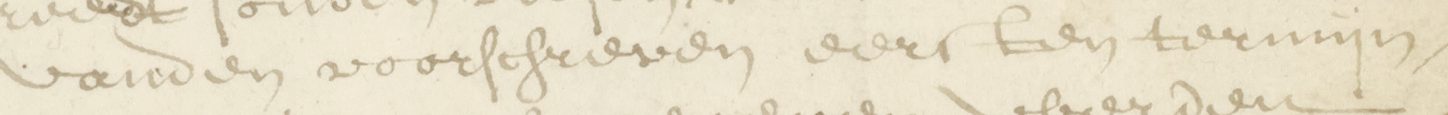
vanden voorschreven eersten termijn,
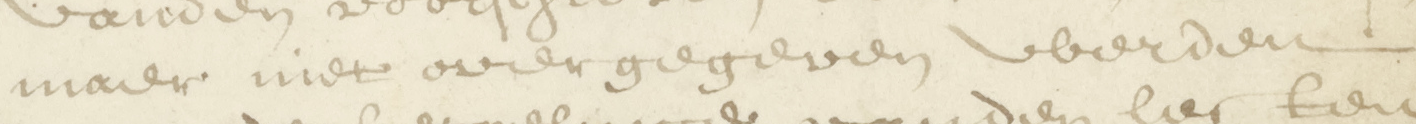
maer niet overgegeven werden
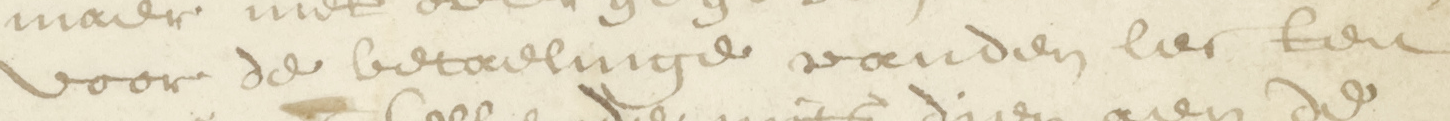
voor de betaelinge vanden lesten
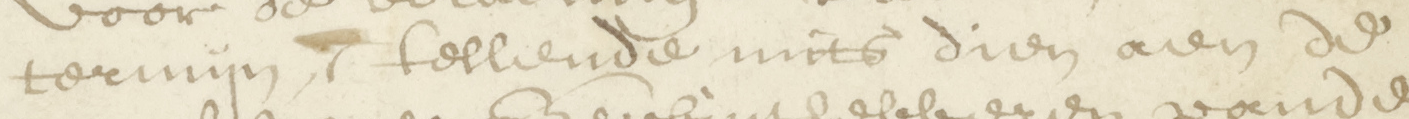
termijn, stellende mits dien aen de
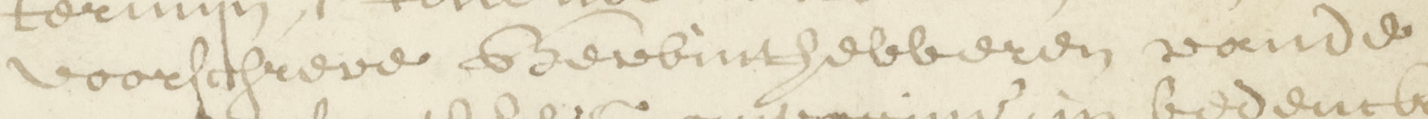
voorschreve Bewinthebberen vande
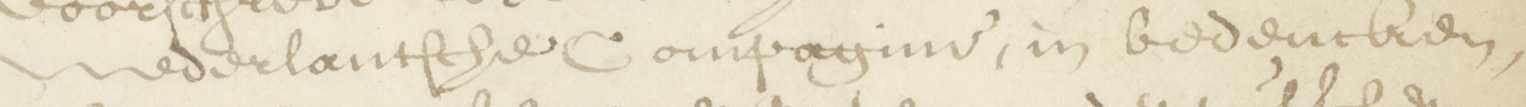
Nederlantsche Compagnie, in bedencken,
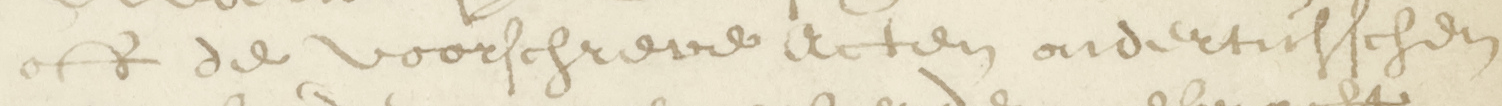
off de voorschreve acten ondertusschen
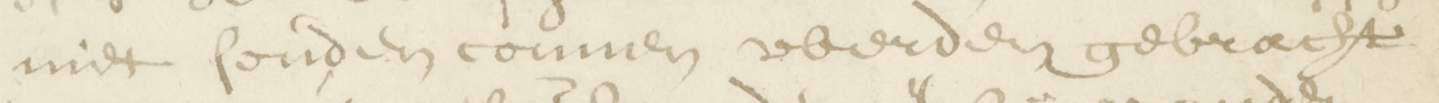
niet souden connen werden gebracht
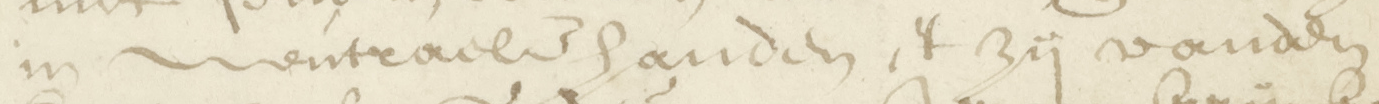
in neutraele handen, 't zij vanden
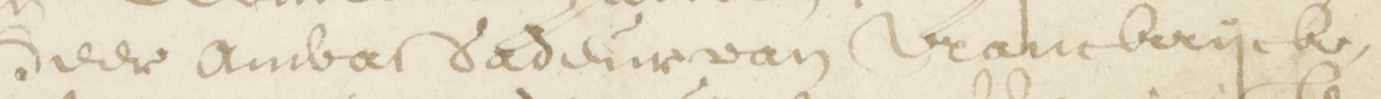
heer ambassadeur van Vranckrijck,
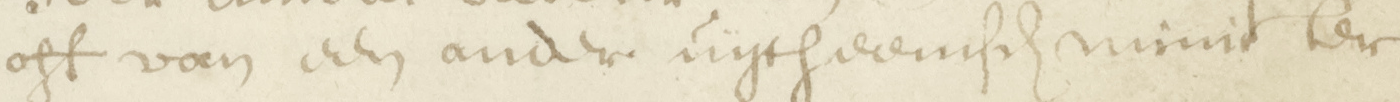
off van een ander uytheemsche minister
